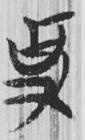○（變）
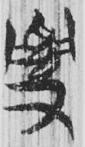○（亂）
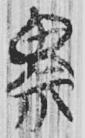○（鬼）
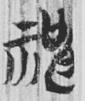神
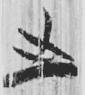之
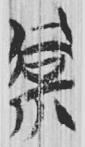○（常）
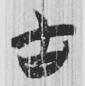古（故）
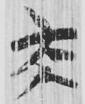夫
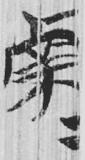帝上
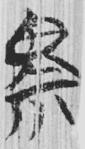○（鬼）
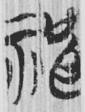神
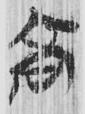高
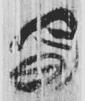明
